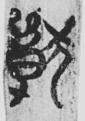○（獸→守）
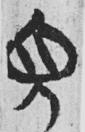○（視）
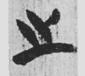之
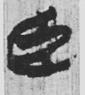臣
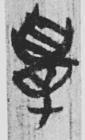辠（罪）
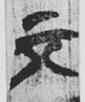亓
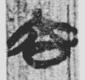㝐（容）
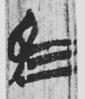於
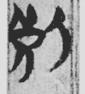死
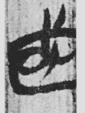或
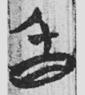昏（昧）
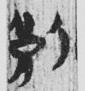死
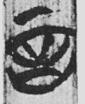言
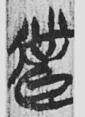○（僕）
